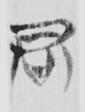君
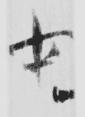才
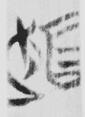𧻚
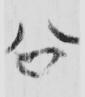公
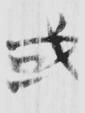或
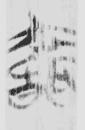{尒䎽}
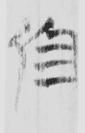於
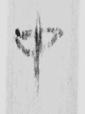中
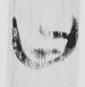曰
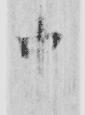中
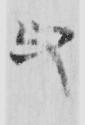父
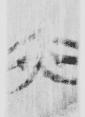亦
